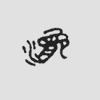瀧
